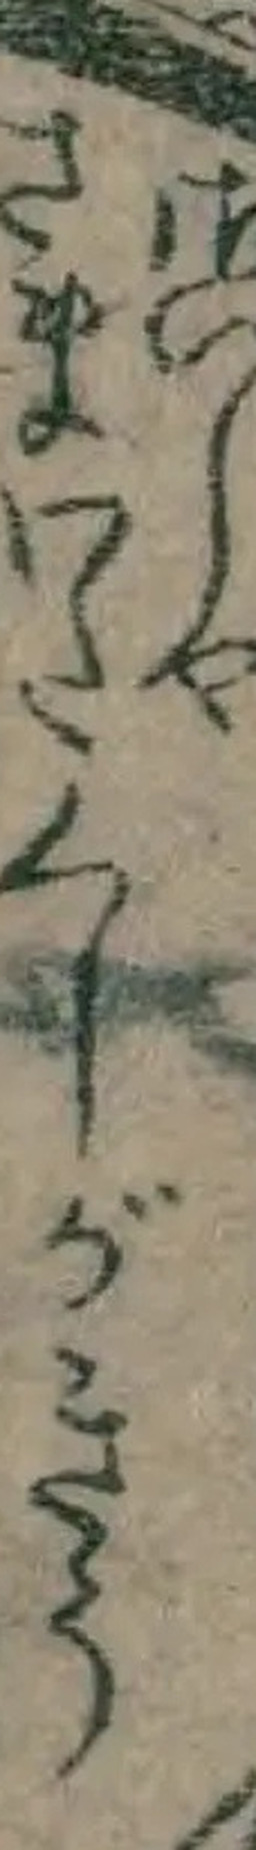さまわたくしがきう
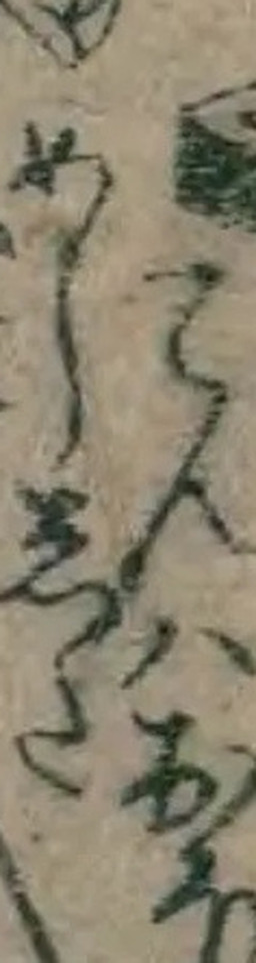めしした
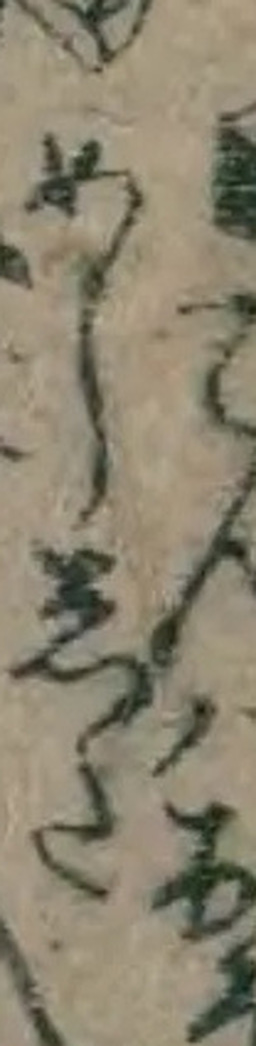めしした

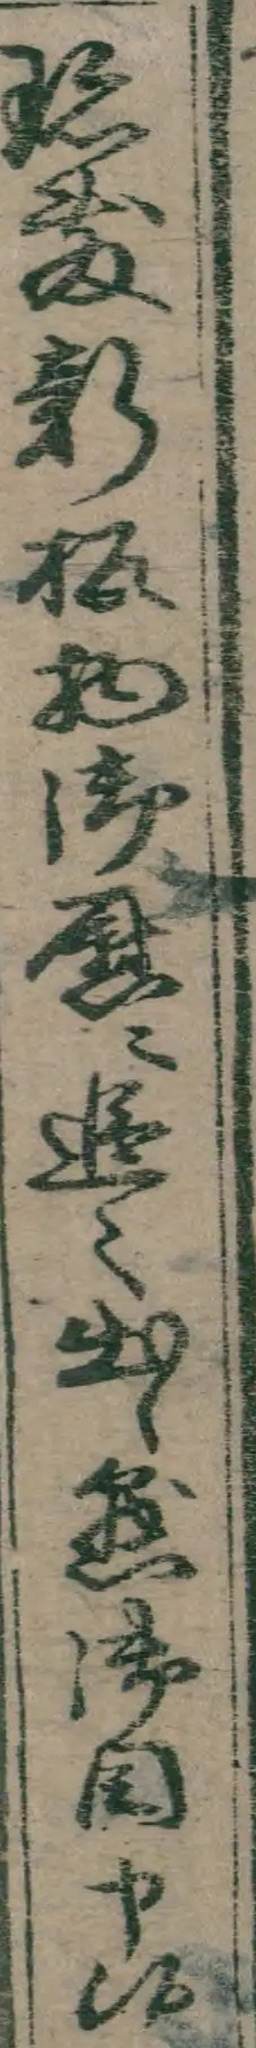珍敷新板物御歴ゝ追々出し懸御目申候
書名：団十郎蓬芥伝
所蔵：国立国会図書館 National Diet Library, JAPAN
